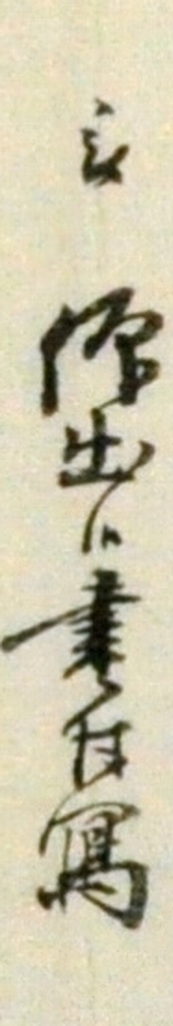被仰出候書付写
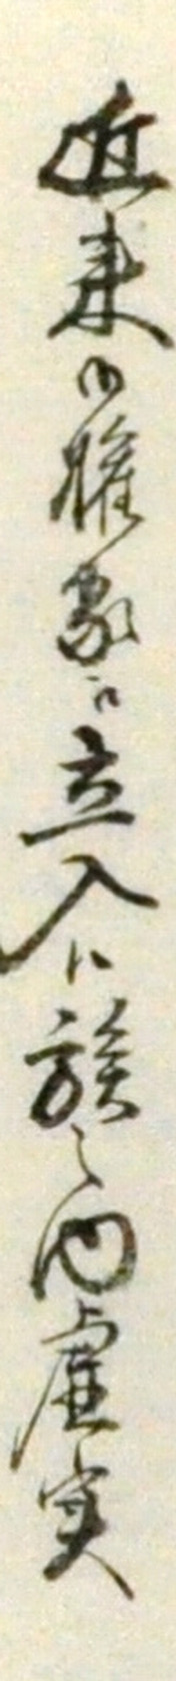近来御権家江立入候族之内虚実
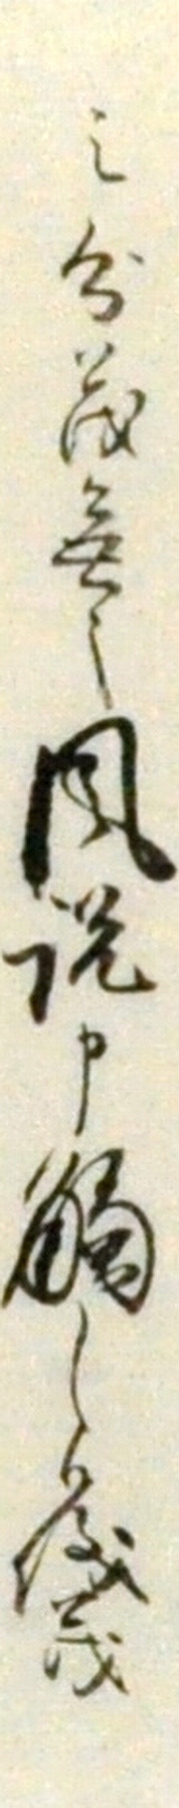之分茂無之風説申触之候儀茂
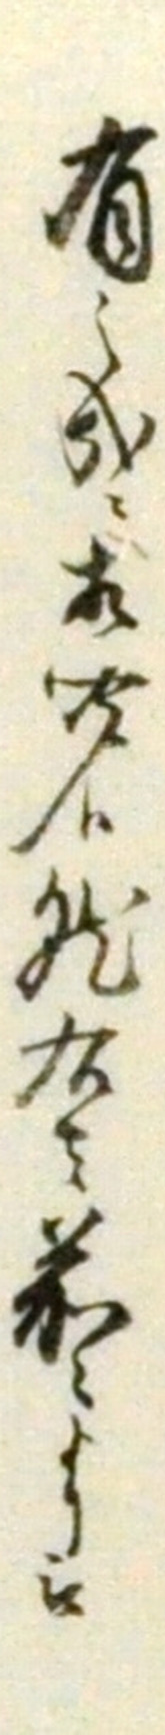有之哉ニ相聞候就右者前々より被
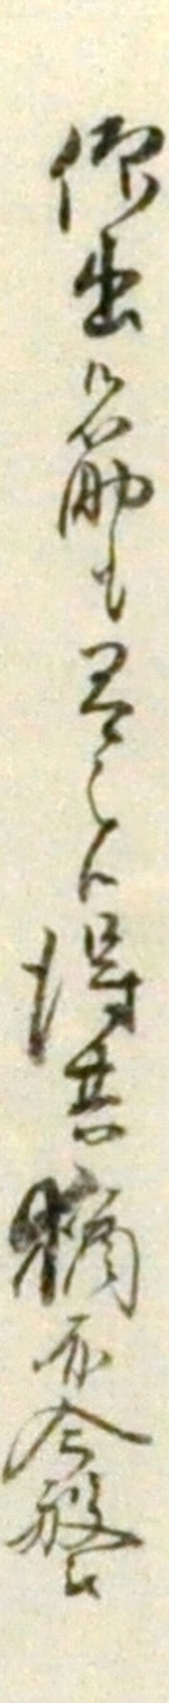仰出候筋も有之候得共猶亦今般被
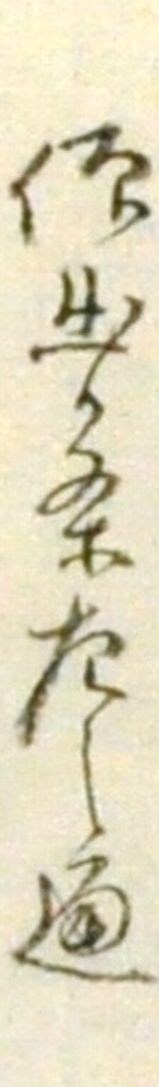仰出候条左之通
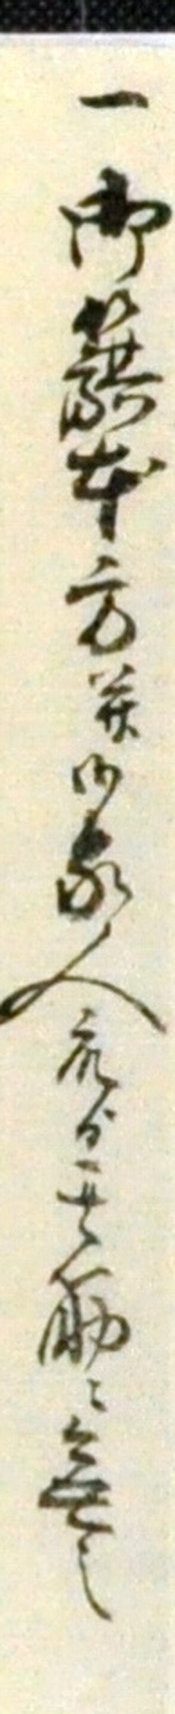一御籏本方并御家人衆ゟ其筋ニ無之
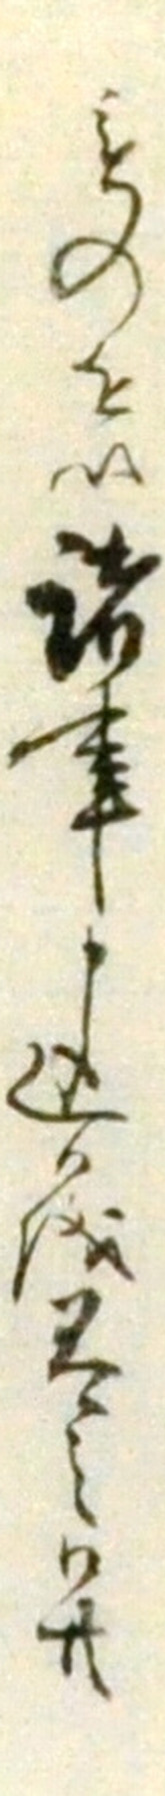ものを以諸事申込候儀有之候共
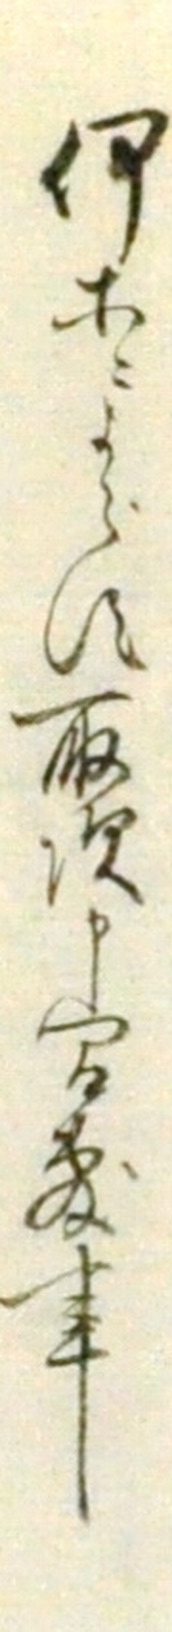何等ニよらす取次申間敷事
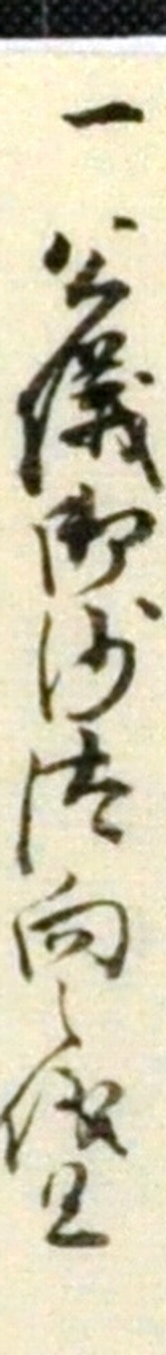一公儀御沙汰向之儀且
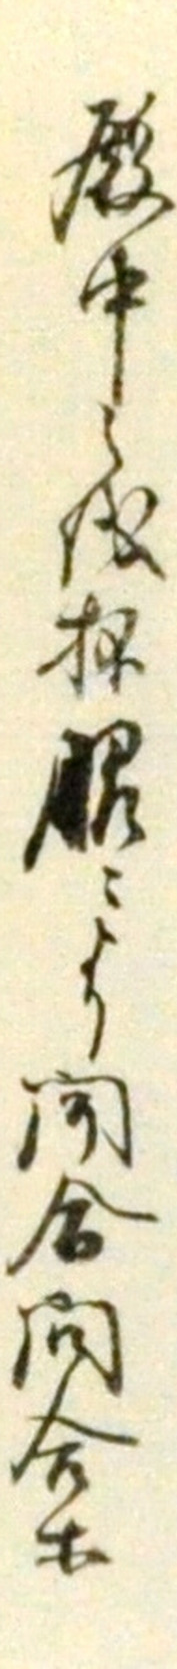殿中之儀抔脇ニより聞合問合等
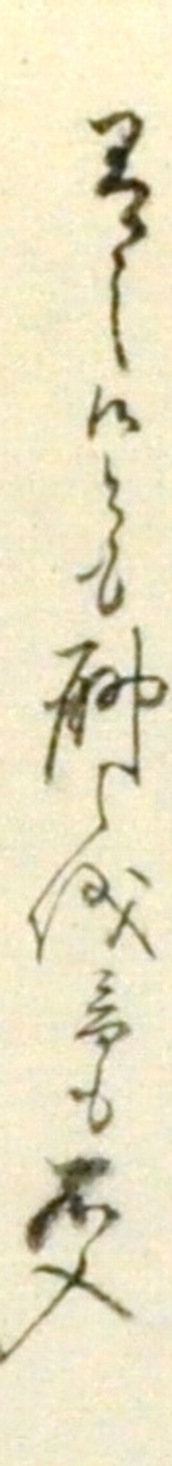有之候とも聊之儀ニ而も不入
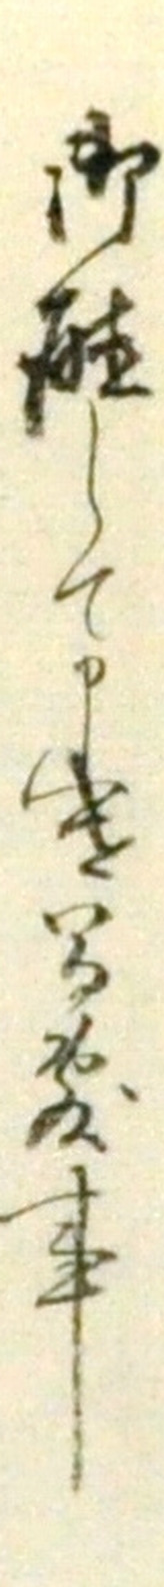御聴して申遣間敷事
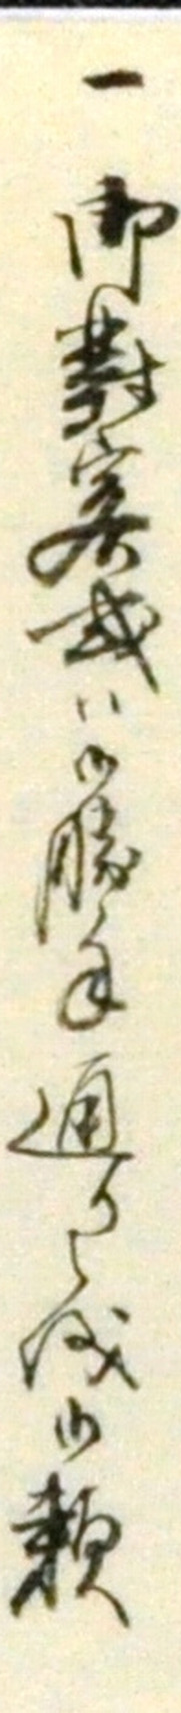一御対客或ハ御勝手通り之儀御頼
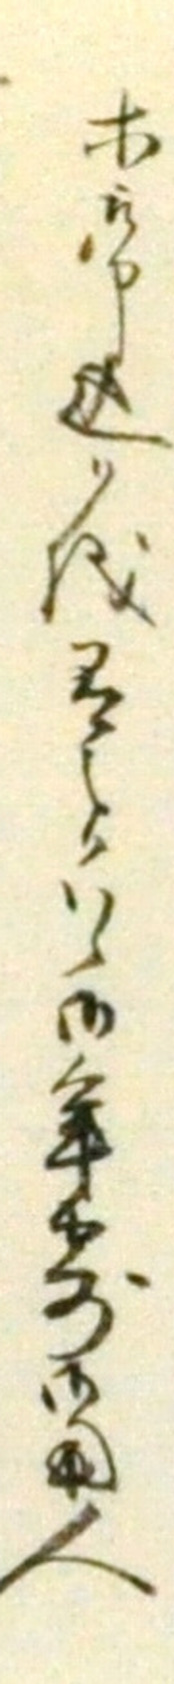等被申込候儀有之候ハヽ御年寄御用人
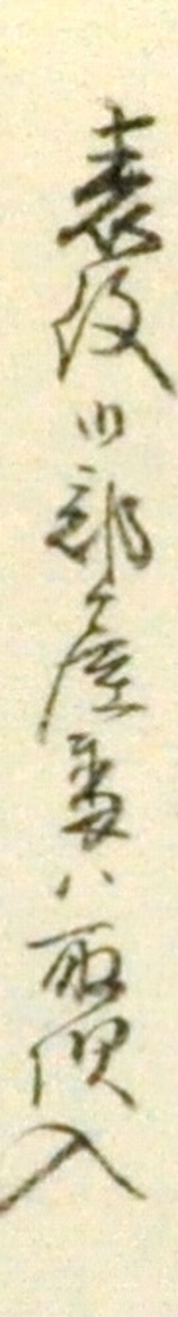表役御部屋番ハ取次入
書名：家中触
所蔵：伊那市立高遠町図書館・合同会社AMANE
